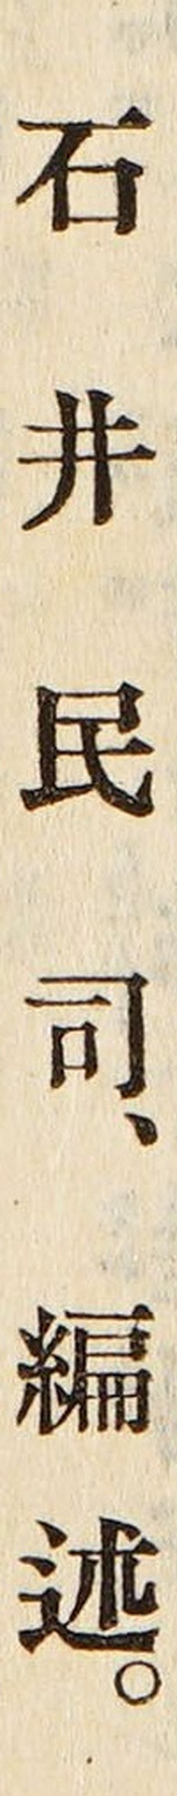石井民司、編述。
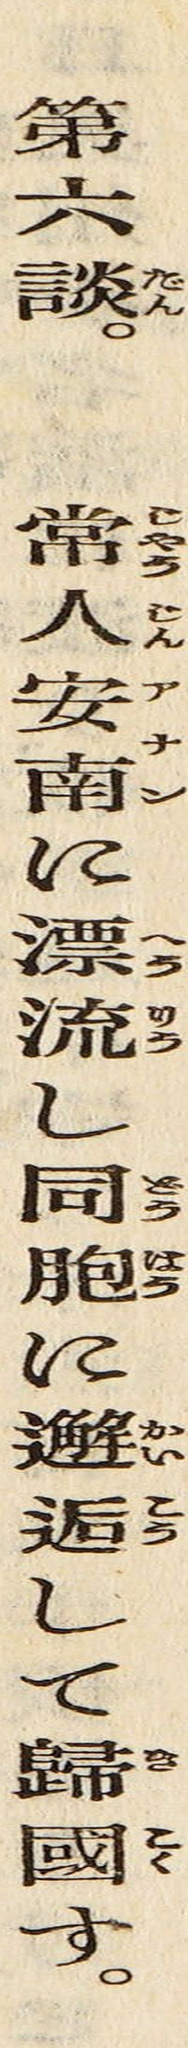第六談。常人安南に漂流し同胞に邂逅して帰国す。
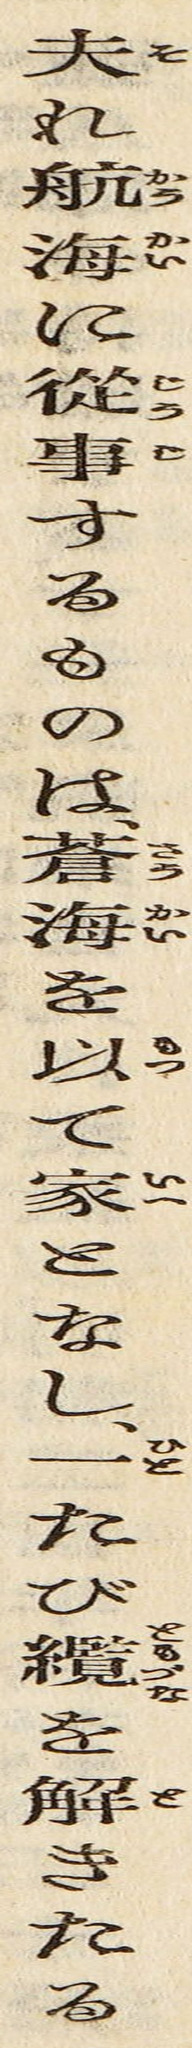夫れ航海に従事するものは、蒼海を以て家となし、一たび纜を解きたる
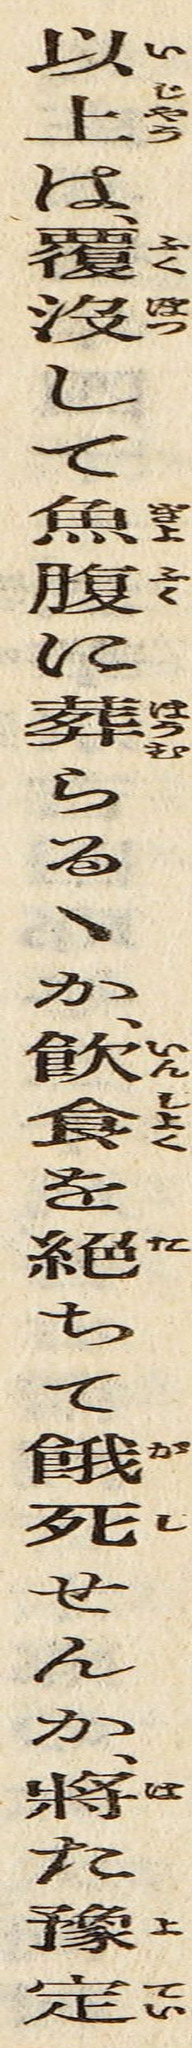以上は、覆没して魚腹に葬らるヽか、飲食を絶ちて餓死せんか、将た予定
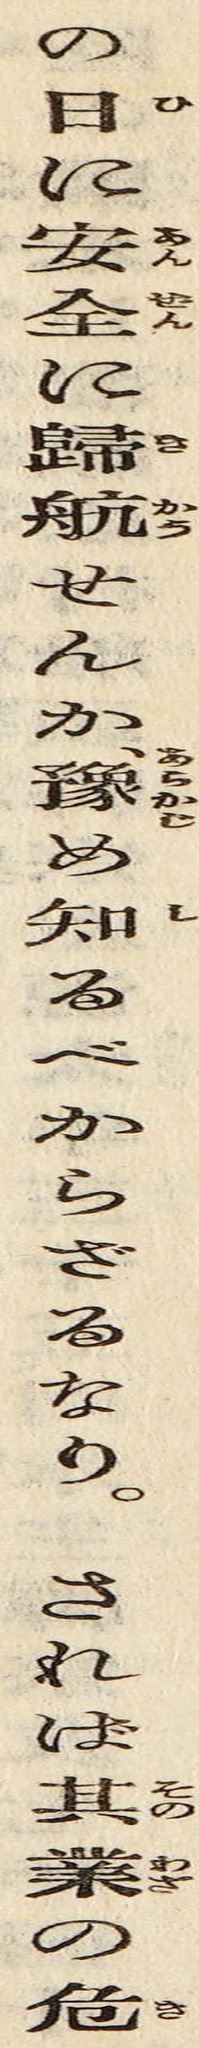の日に安全に帰航せんか、予め知るべからざるなり。されば其業の危
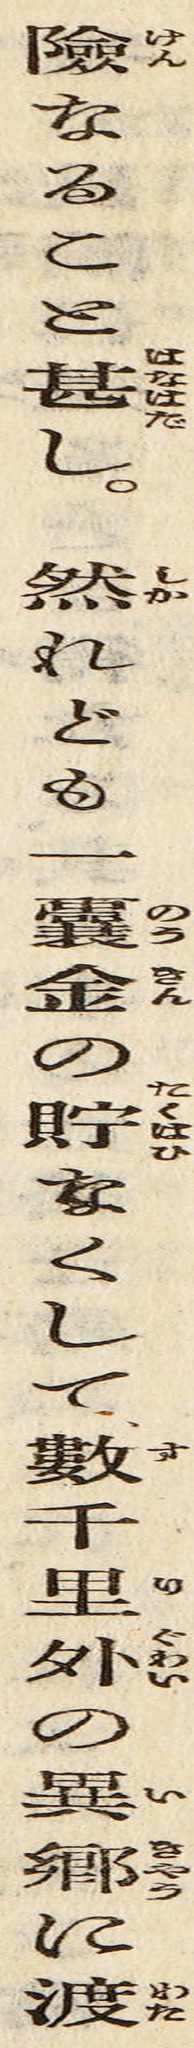険なること甚し。然れども一囊金の貯なくして数千里外の異郷に渡
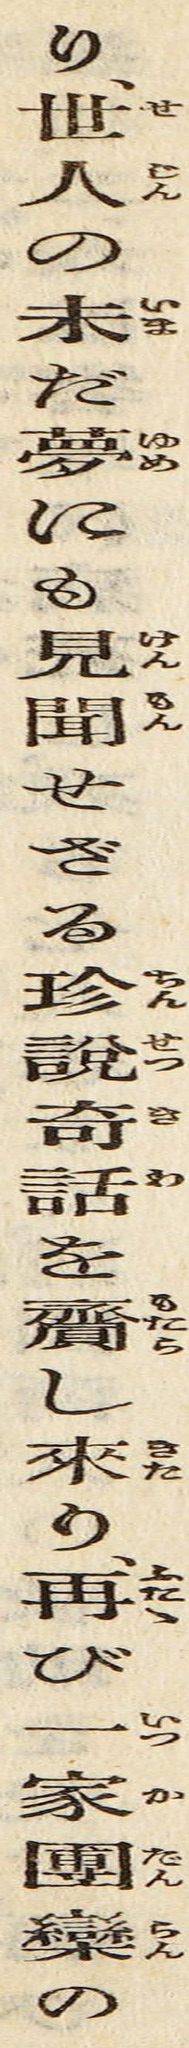り、世人の未だ夢にも見聞せざる珍説奇話を齎し来り、再び一家団欒の
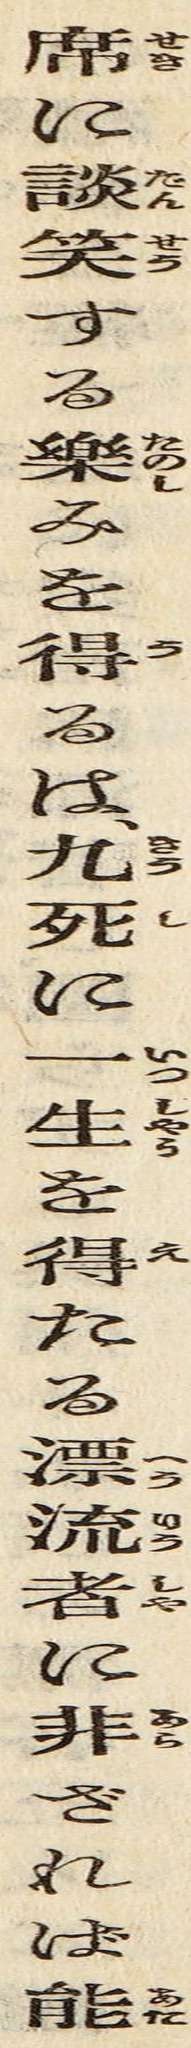席に談笑する楽みを得るは、九死に一生を得たる漂流者に非ざれば能
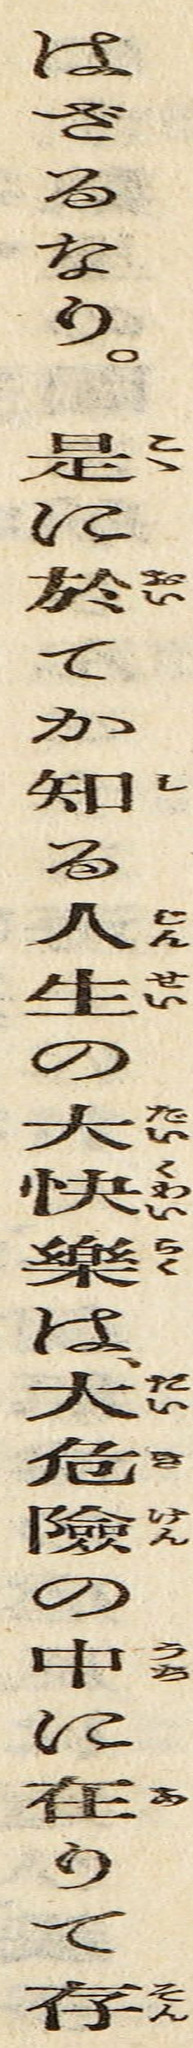はざるなり。是に於てか知る人生の大快楽は、大危険の中に在りて存
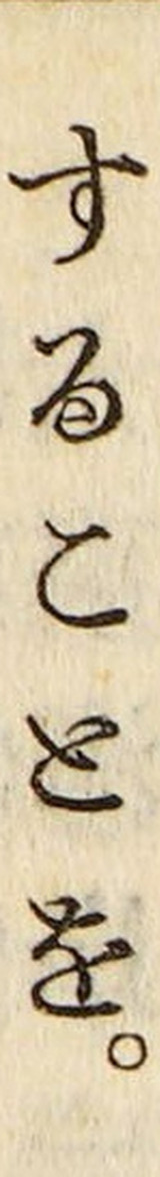することを。

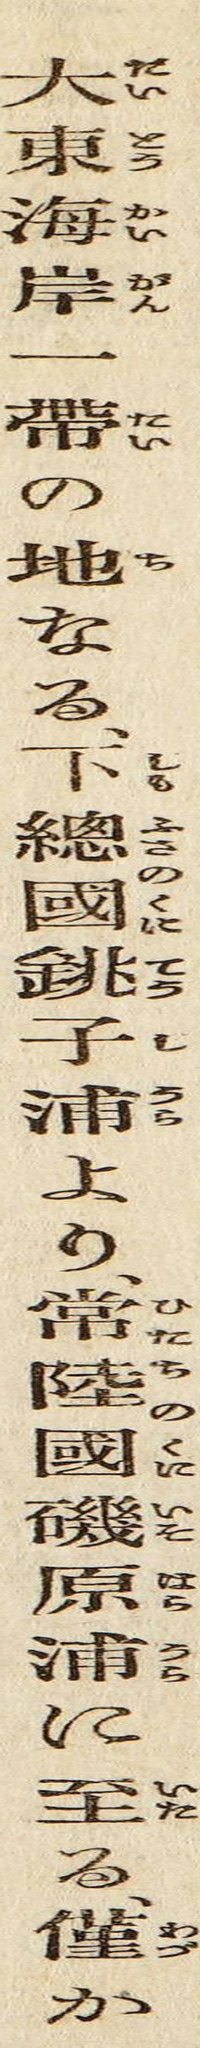大東海岸一帯の地なる、下総国銚子浦より、常陸国磯原浦に至る、僅か
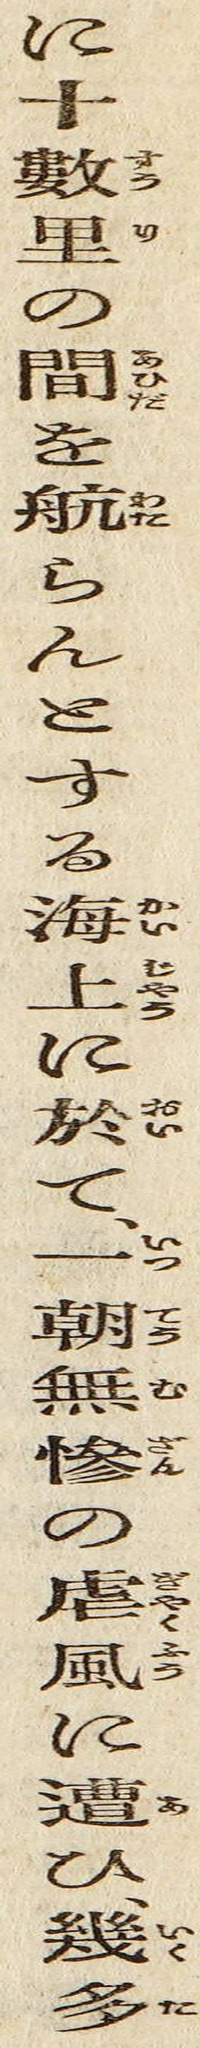に十数里の間を航らんとする海上に於て、一朝無惨の虐風に遭ひ、幾多
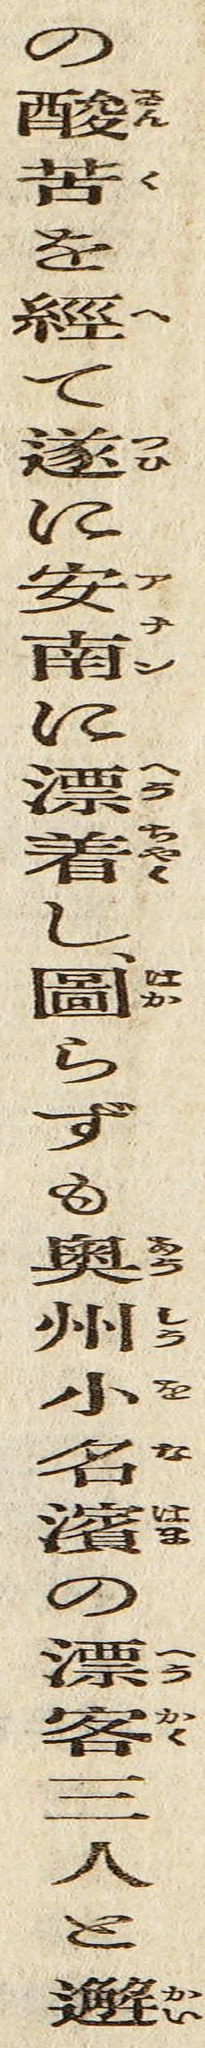の酸苦を経て遂に安南に漂着し、図らずも奥州小名浜の漂客三人と邂
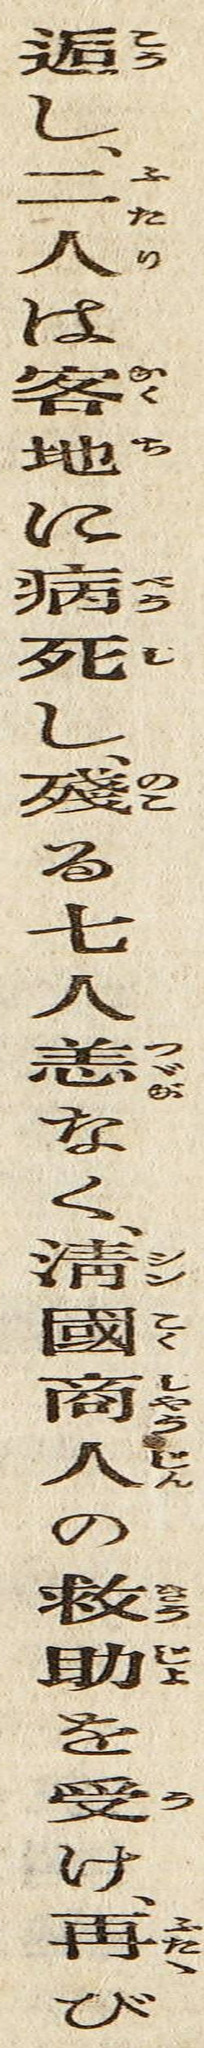逅し、二人は客地に病死し、残る七人恙なく、清国商人の救助を受け、再び
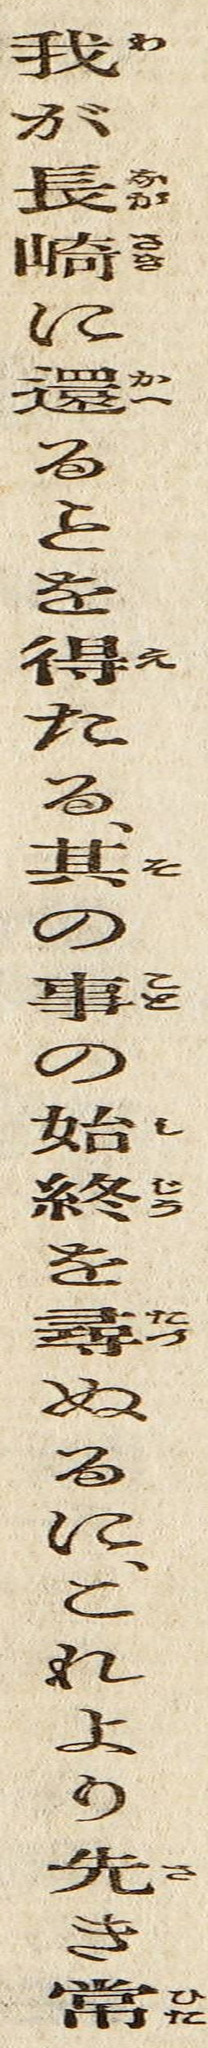我が長崎に還ることを得たる、其の事の始終を尋ぬるに、これより先き常
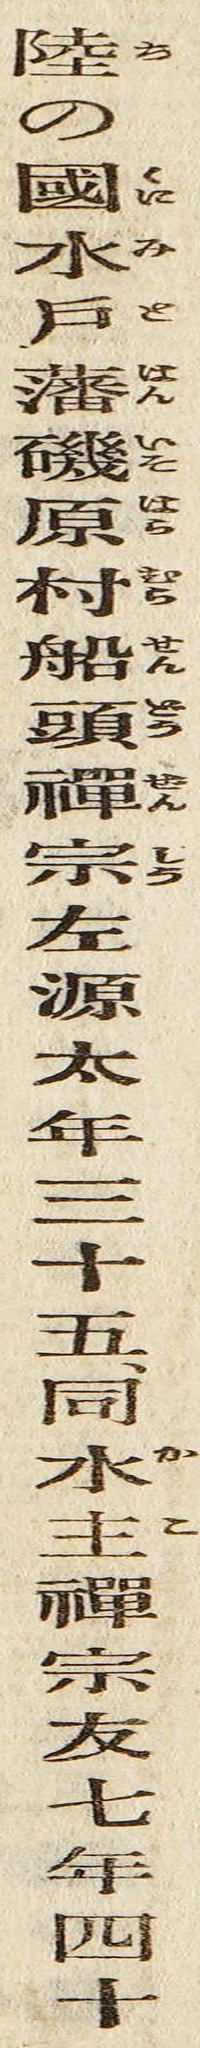陸の国水戸藩磯原村船頭禅宗左源太年三十五、同水主禅宗友七年四十
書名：日本漂流譚
